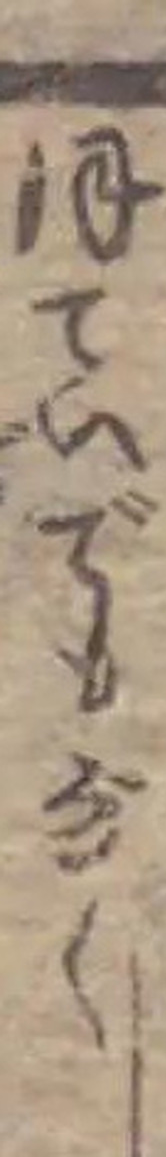ほていでもなく
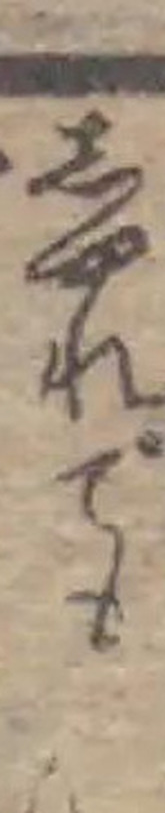しやれでも
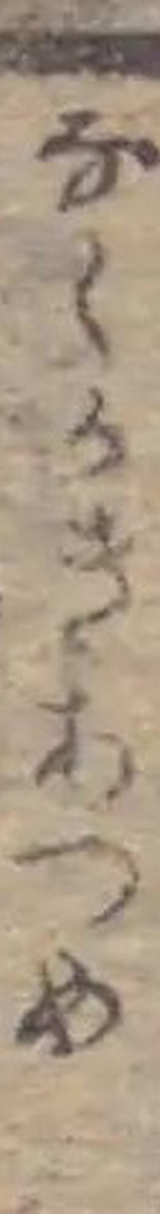なくかきあつめ
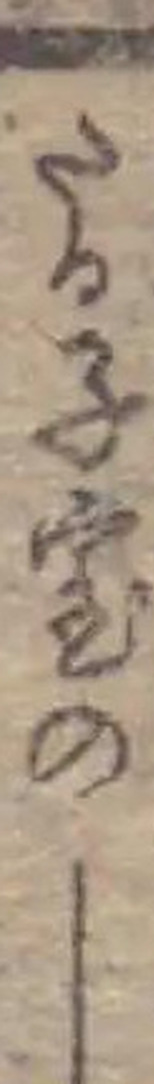たる子宝の
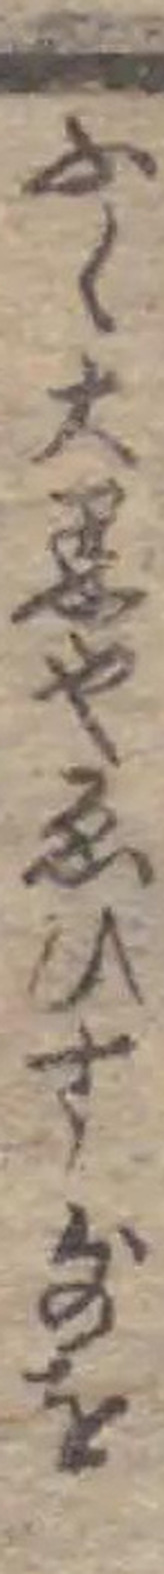ふく大黒やゑひす哥を
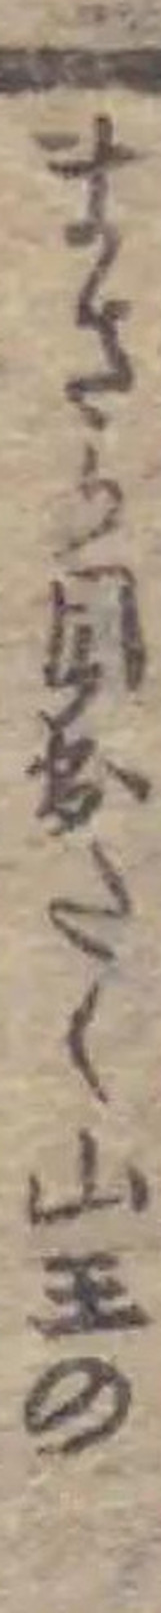まさか目出たく山王の
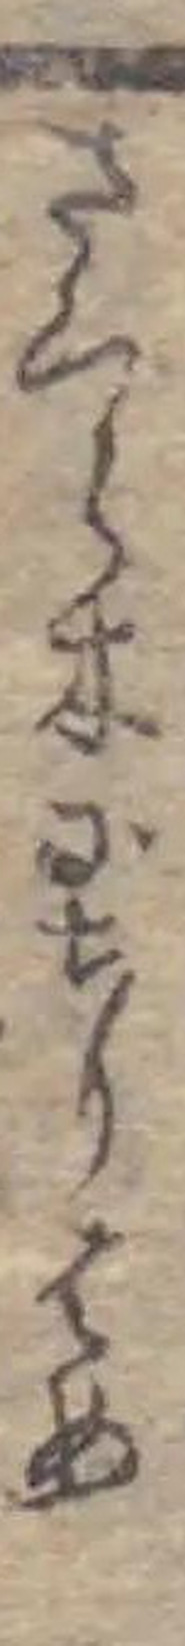さくら木にちりはめ
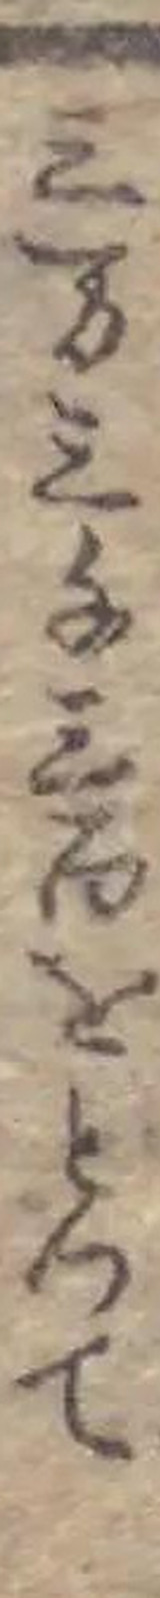三万三千三百をとつて
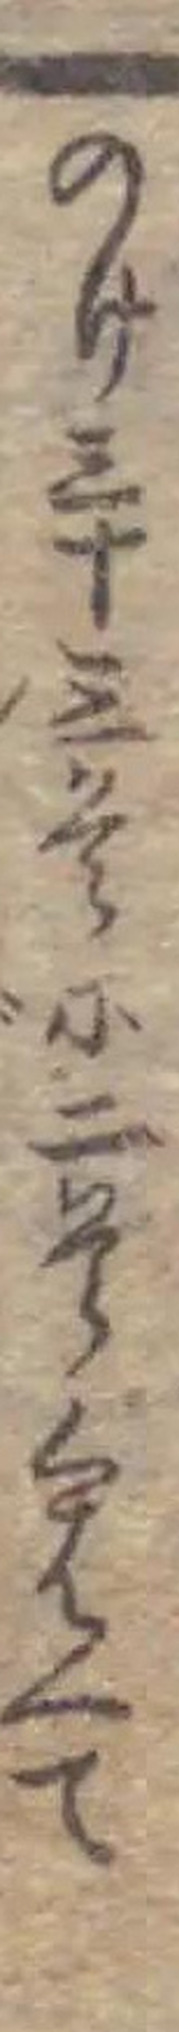のけ三十三首に二首くはへて
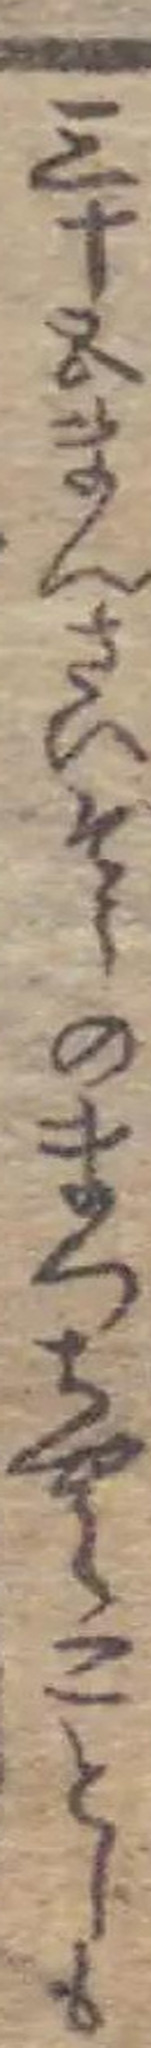三十五まんさいぞうのまつちやらことしも
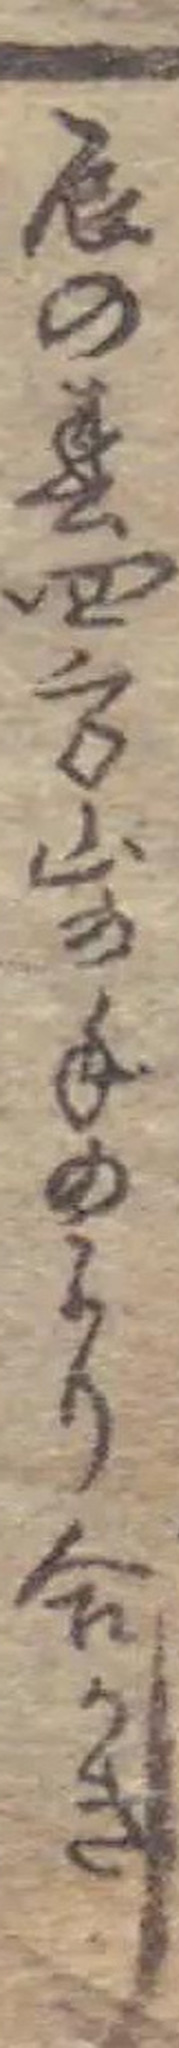辰の春四方山の手のより合かき
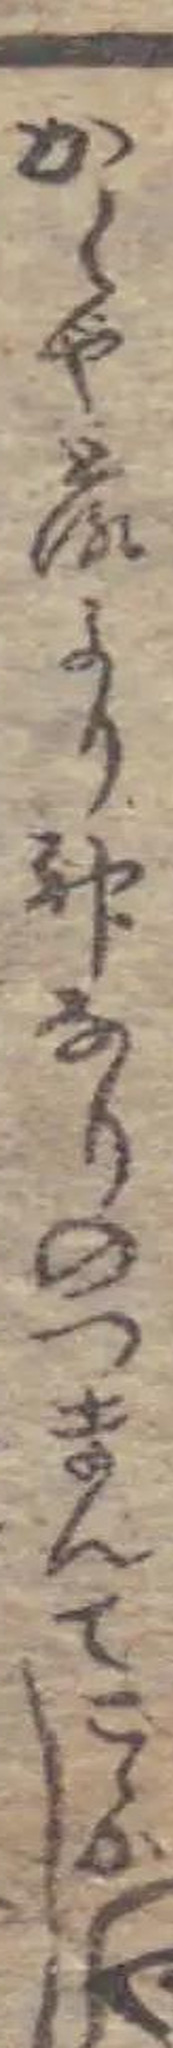かし？やと？る？より神なりのつまんてこゝに
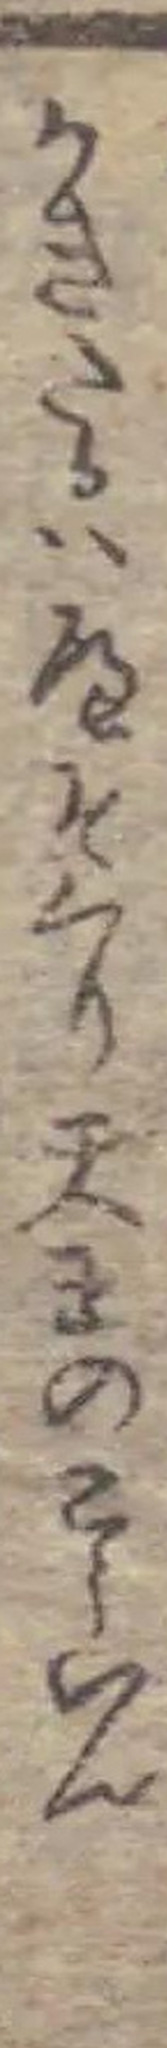かきたるはへそくり天王のこういん
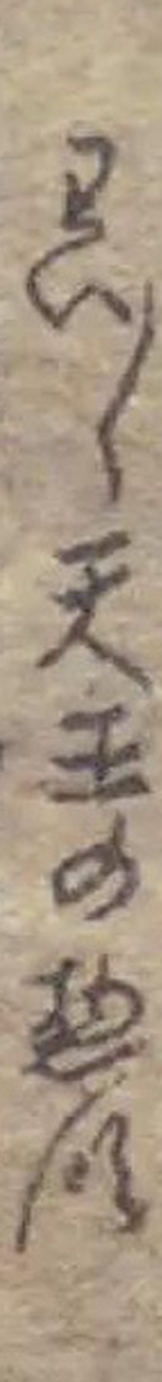わい〳〵天王の惣領
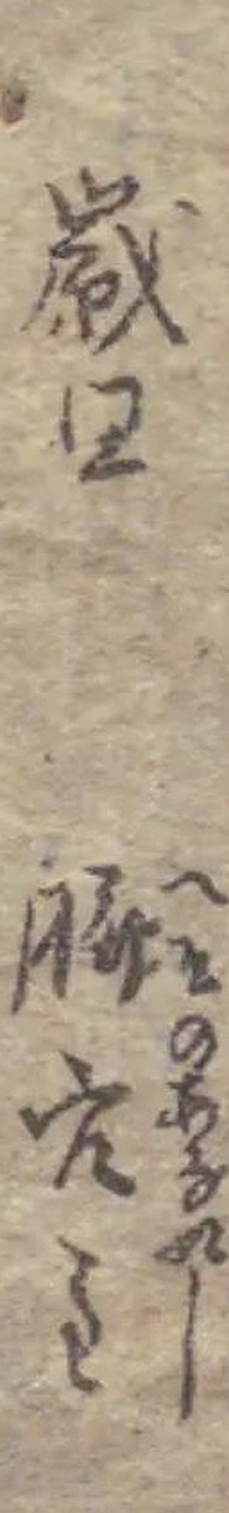歳旦臍穴主
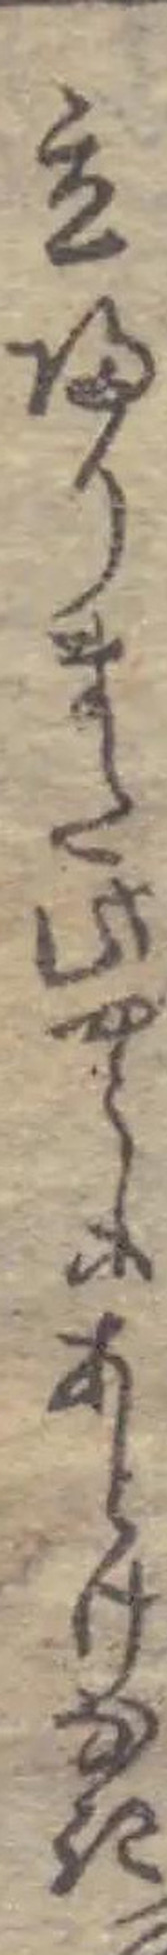立帰りまた此やうにあとけなき
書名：金平子供遊 2巻
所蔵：国立国会図書館 National Diet Library, JAPAN
